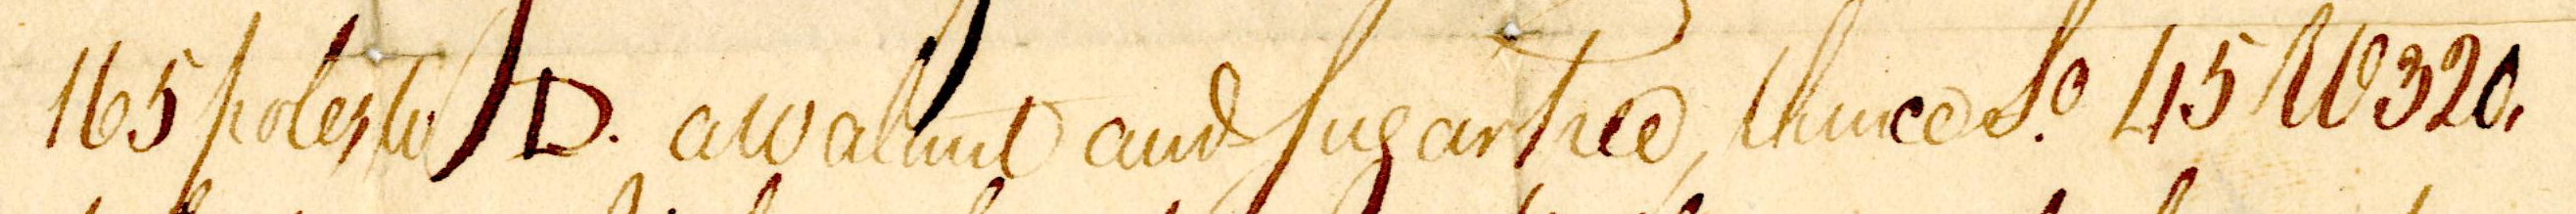165 poles D. a walnut and Sugar tree thence So. 45 W 320.
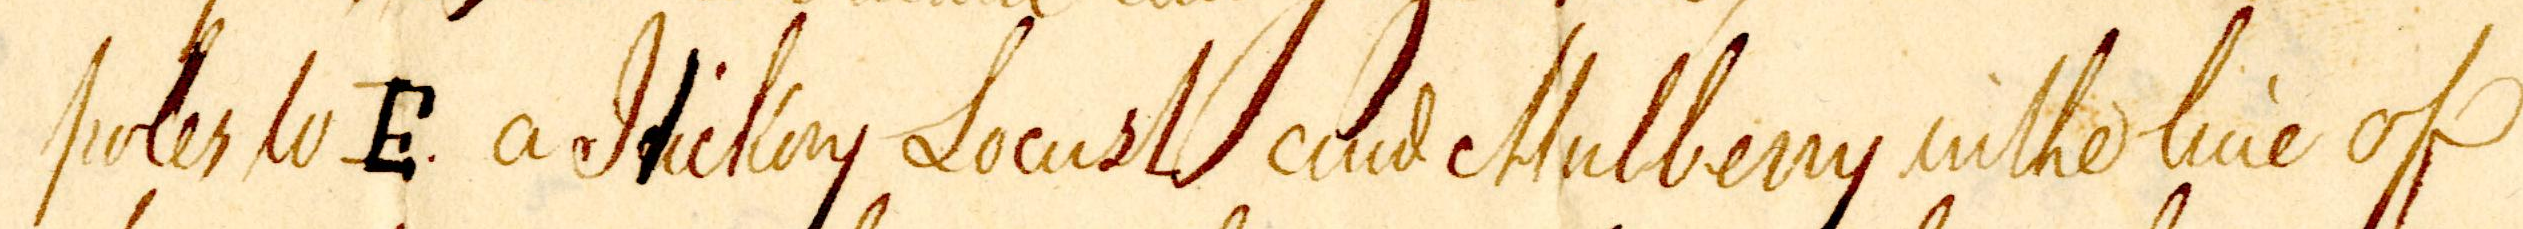poles to E .a Hickory Locust and Mulberry in the line of
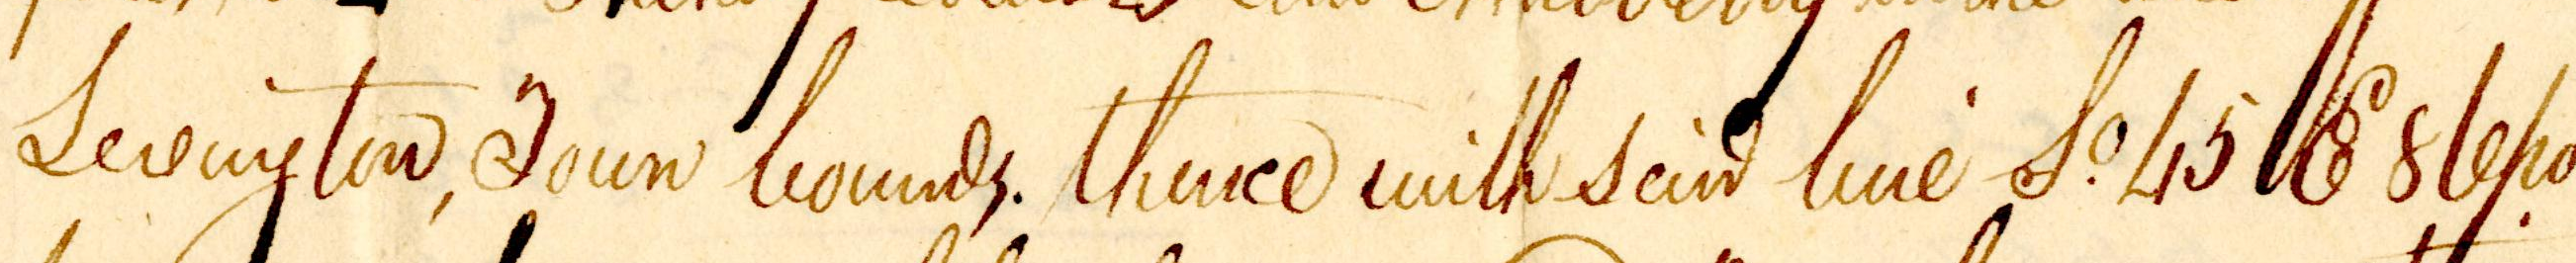Lexington, Town bounds, thence with said line S^o. 45 E 86po.
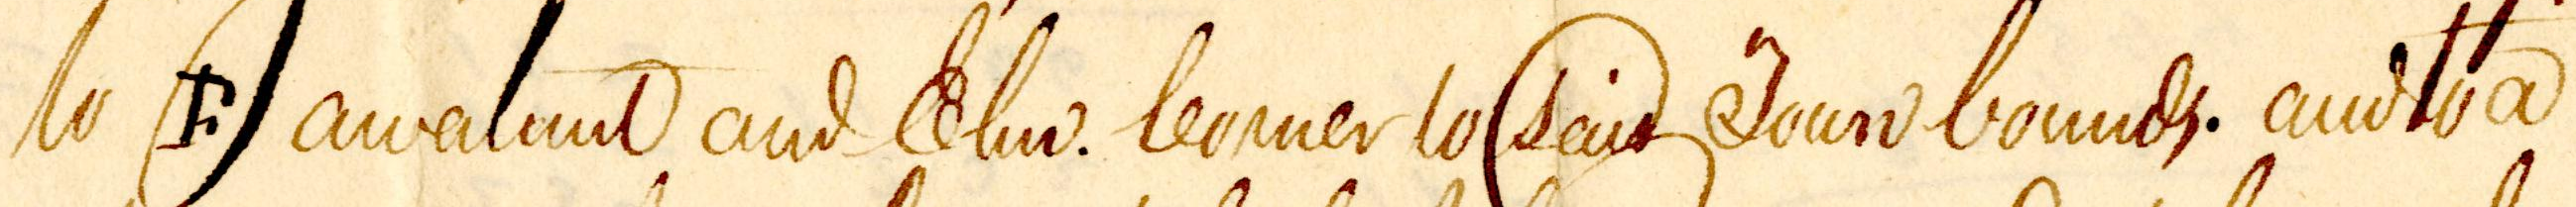to F a walnut and Edw. Corner to Said Town bounds. and to a
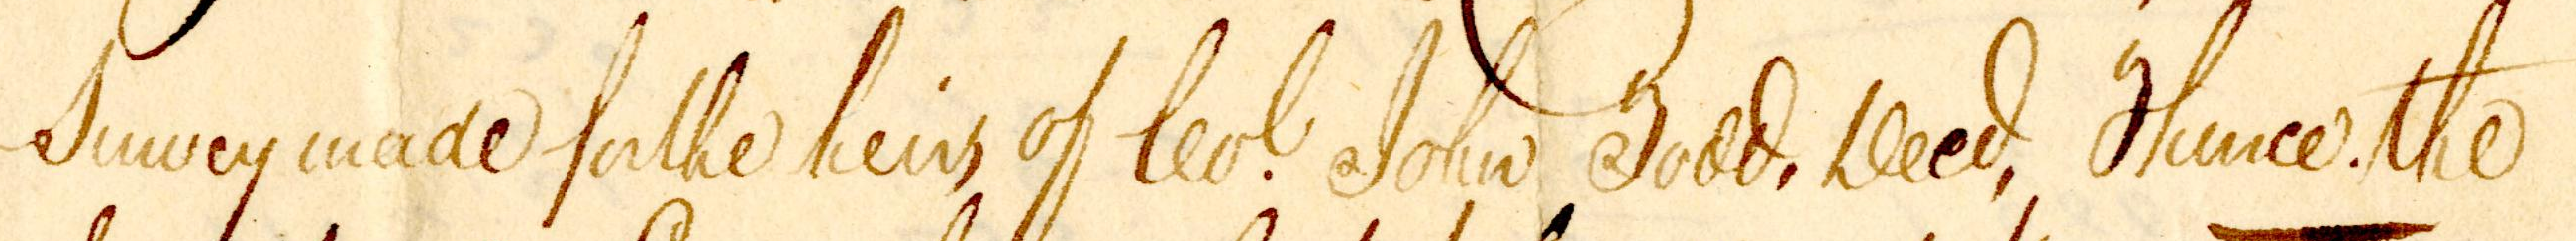Survey made for the heirs of Co^l. John Todd. Deed, thence the
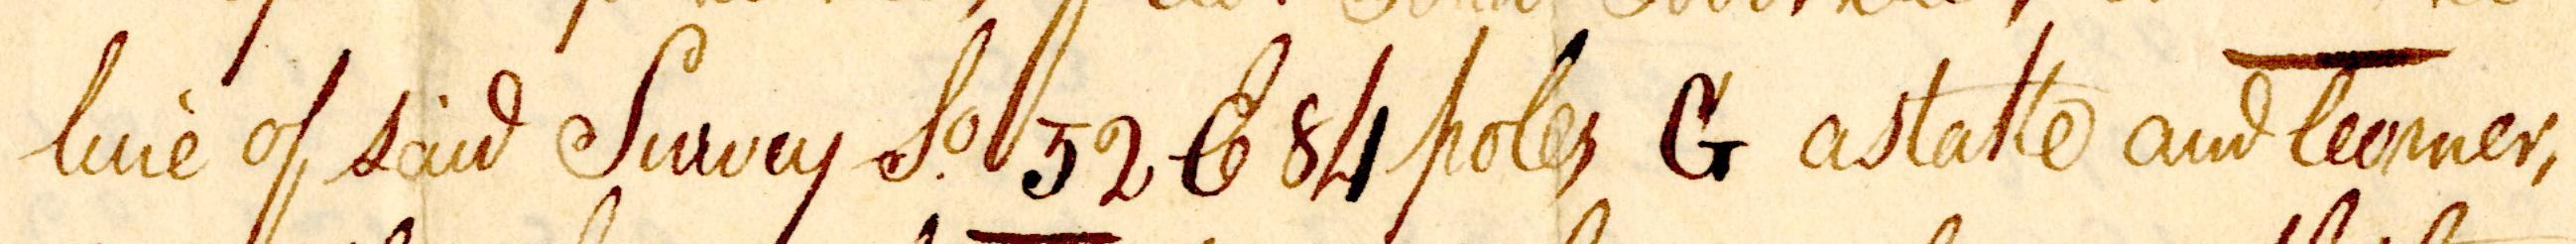line of said Survey So. 52 E 84 poles G a stake and Corner,
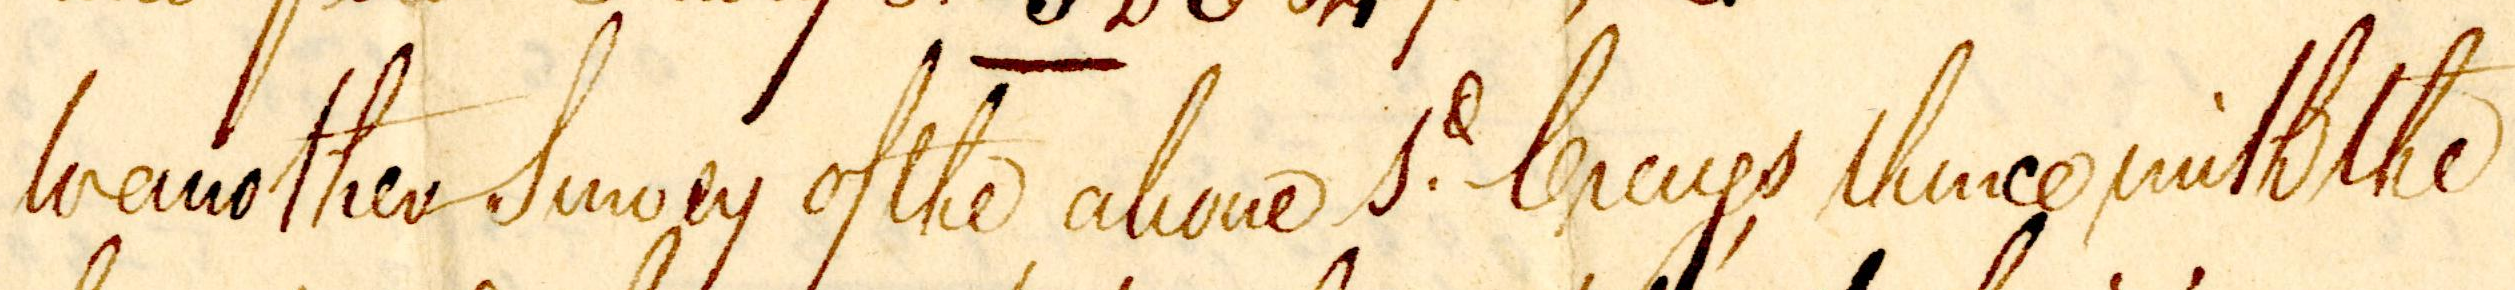being then survey of the above s^d. Crags thence with the
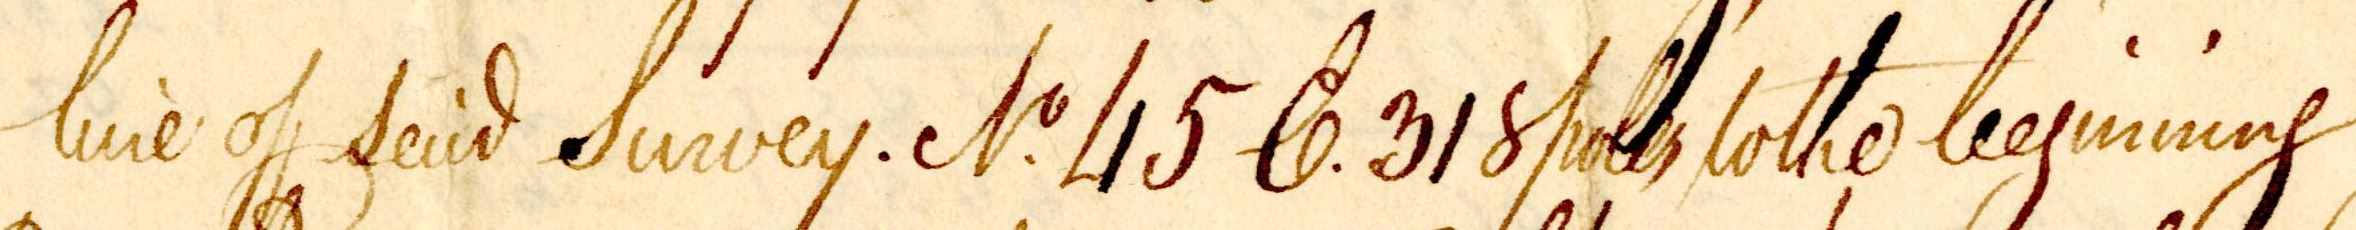line of said Survey N^o. 45 E. 318 poles to the beginning
